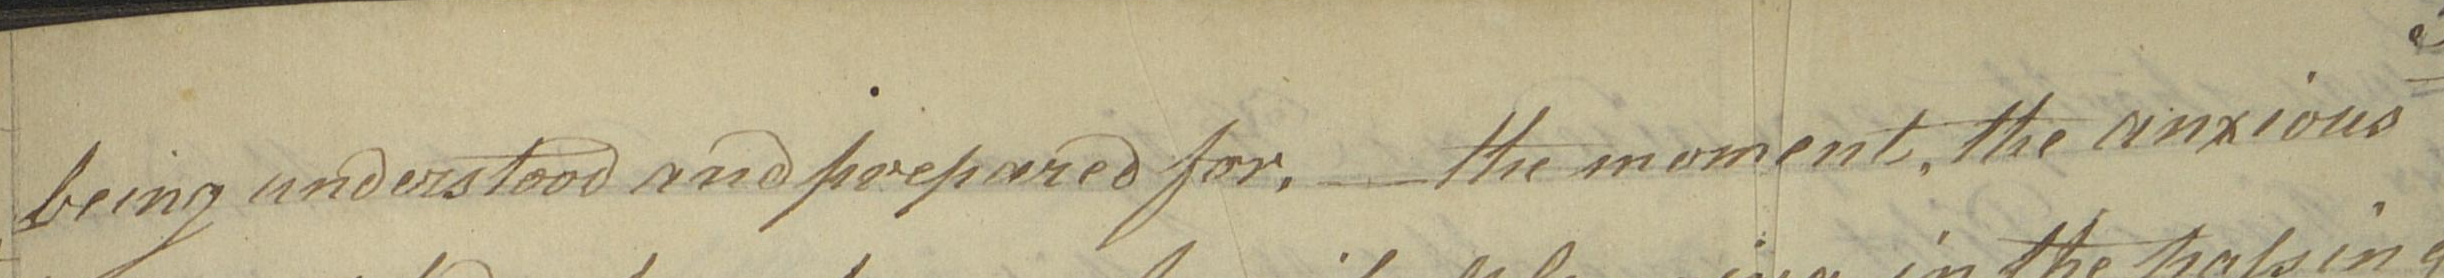being understood and prepared for. The moment the anxious
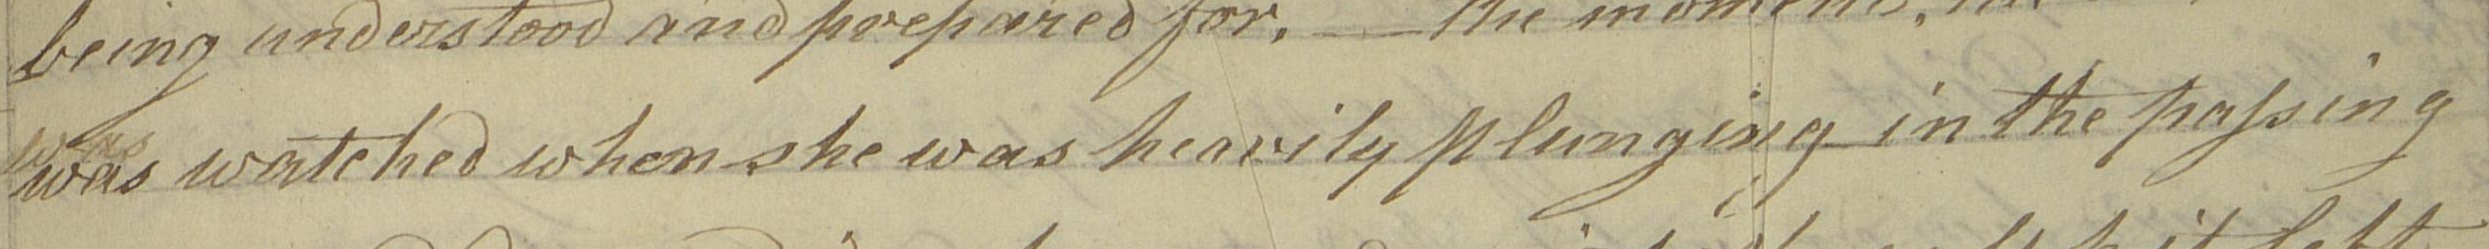was watched when she was hearily plunging in the passing
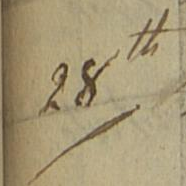28^th
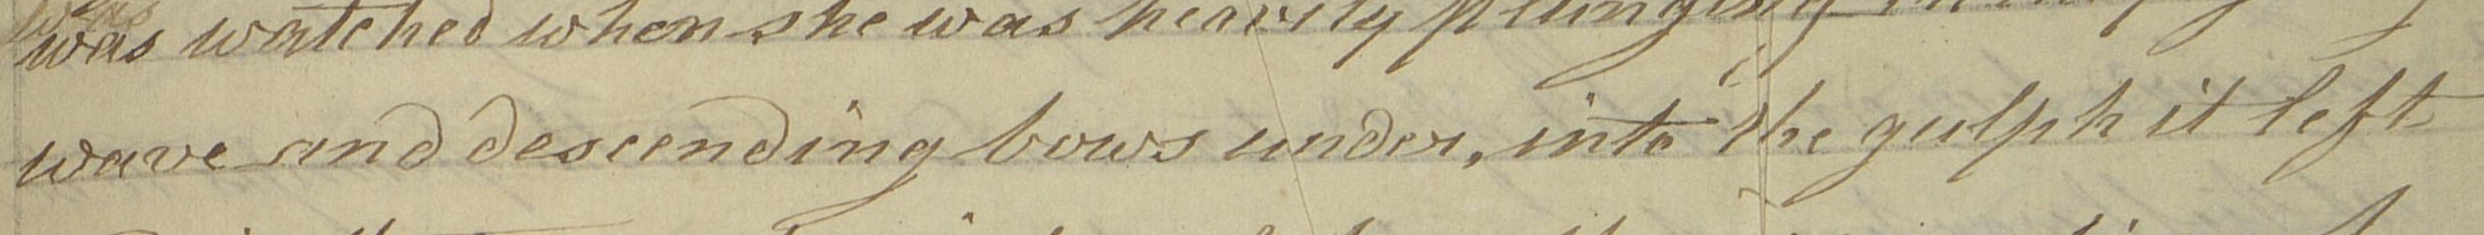wave and descending bows under, into the gulph it left
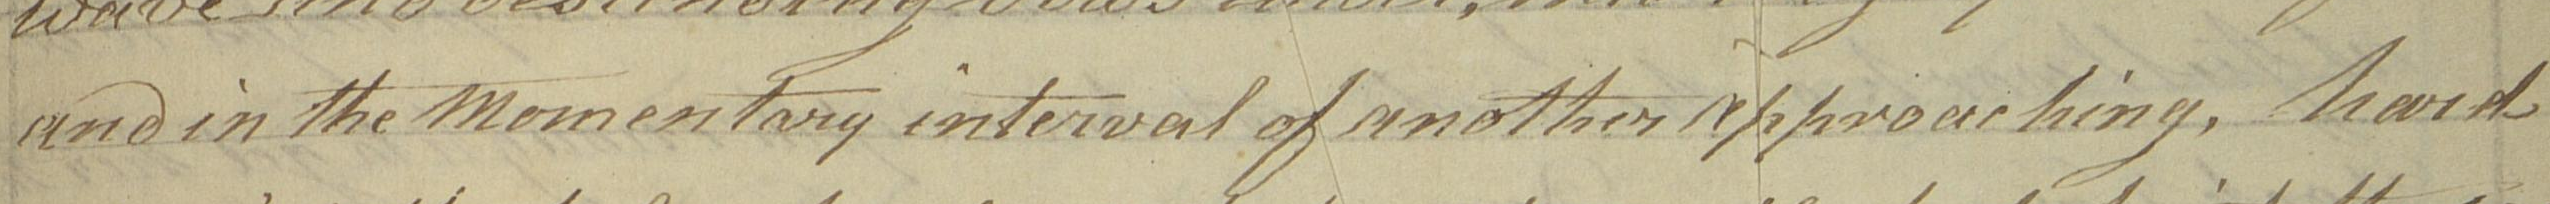and in the Momentary interval of another approaching, hard
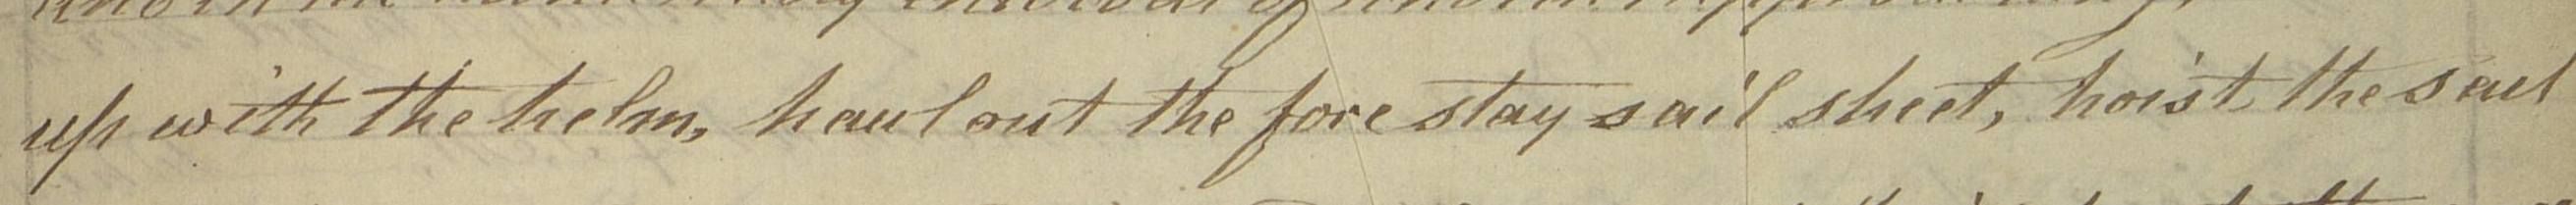up with the helm haul out the fore stay sail sheet, hoist the sail
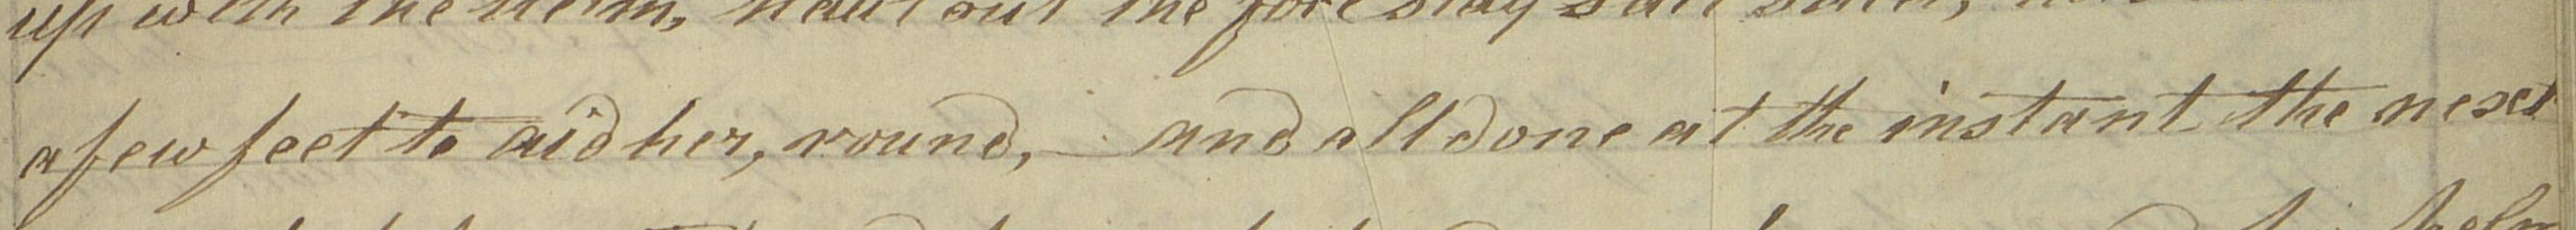a few feet to aid her, round, and all done at the instant the next
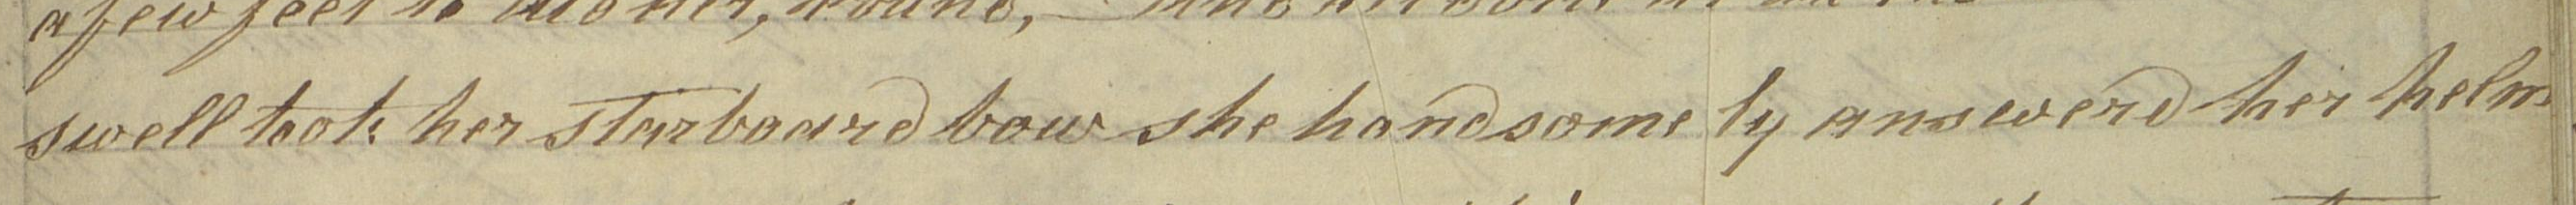swell took her starboard bow she handsomely answerd her helm
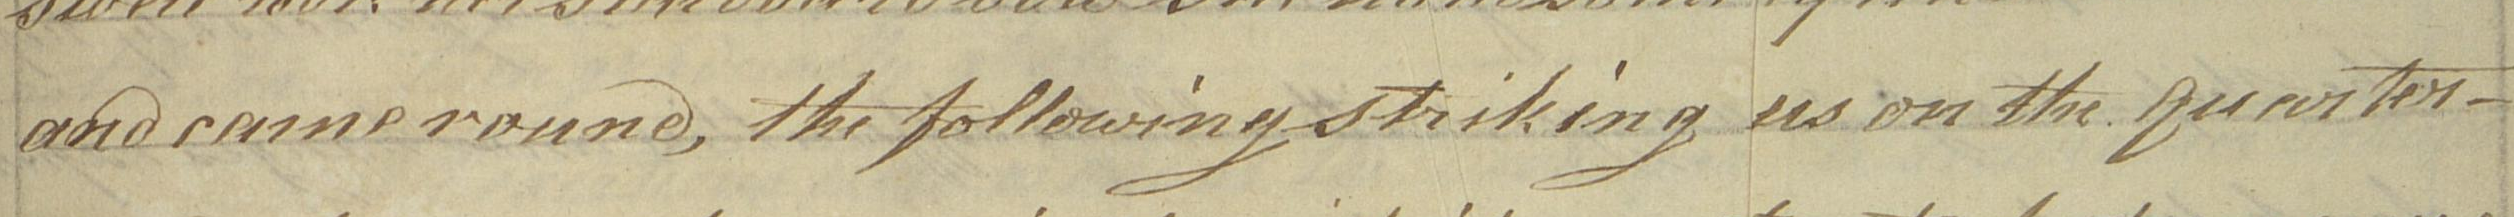and came round, the following striking us on the quarter
